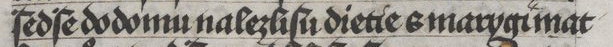ẛedẛe do domu nalezli ſu dietie s marygí mat¬
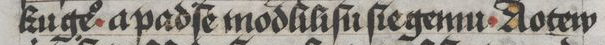ku ḡeo a padẛe modlili ſu ſie gemu.Aotew¬
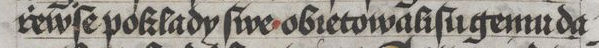ṙewẛe poklady ſwe.obietowaliſu gemu da¬
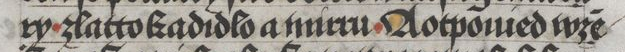ry.zlatto kadidlo a mirru.A otpouied wzē¬
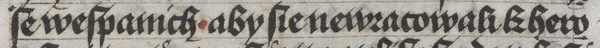ẛe weſpanich.aby ſie newracowali k hero¬
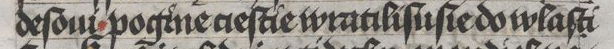deſoui.pogine cieſtie wratilí ſú ſíe do wlaſti
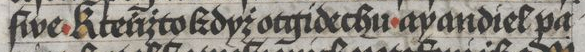ſwe.Kteṙiżto kdyż otgidechu.ay andiel pa¬
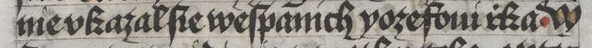nie vkazal ſie weſpaních yozeſoui ṙka.W¬
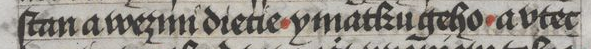ſtan a wezmi dietie.ymatku geho.a vtec
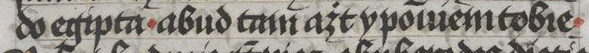do egipta.abud tam ażt y pouíem tobie.
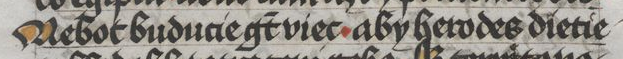Nebot buducíe ḡt viec.aby herodes díetie¬
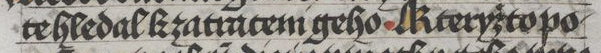te hledal k zatracení geho.Kteryżto po¬
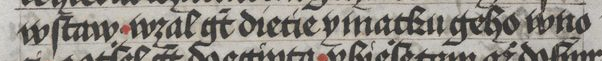wſtaw.wzal ḡt díetíe y matku geho wno¬
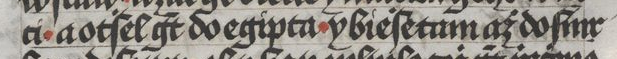ci.a otẛel ḡt do egipta.y bieẛe tam aż doſmr¬
